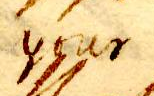your
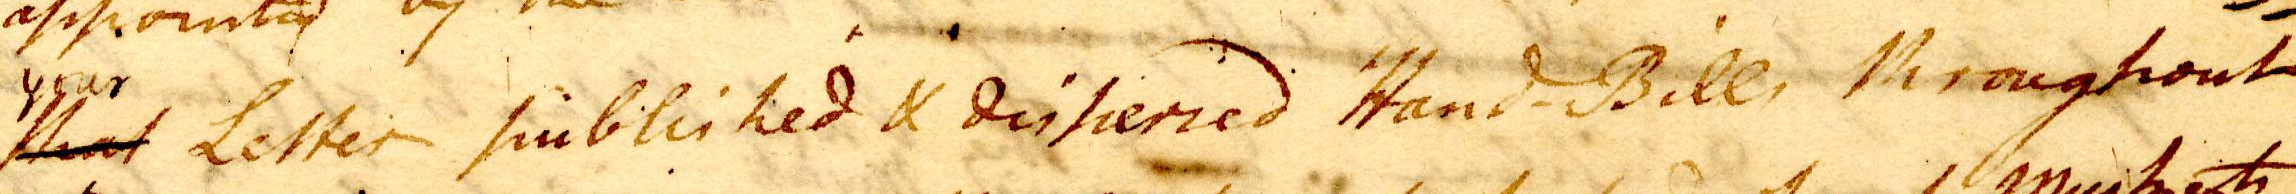[that] ^ Letter published & dispersed Hand- Bills throughout
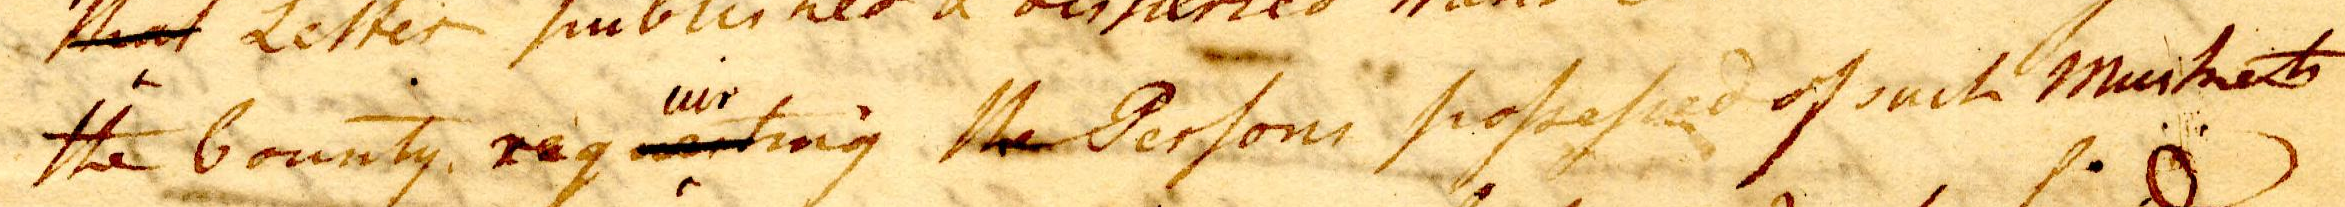the County req[uest]ing the Persons possessed of such Muskets
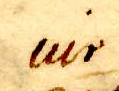uir
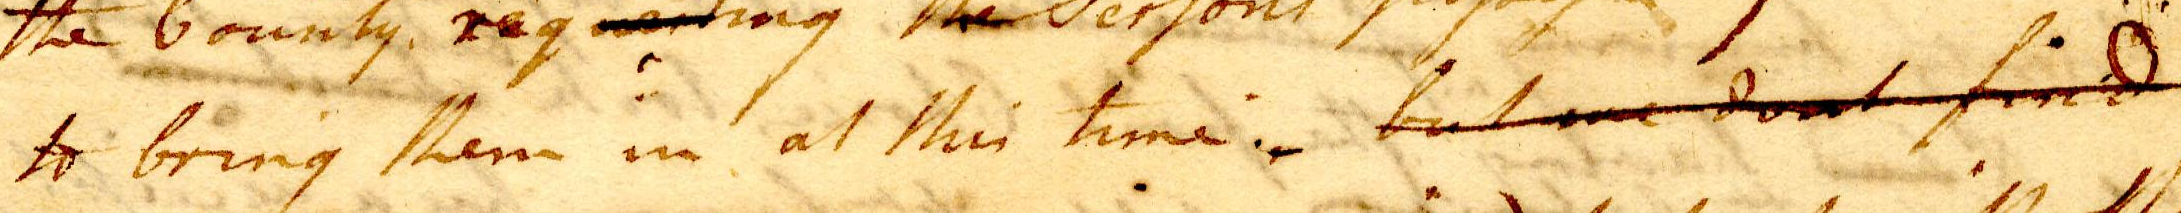to bring them in at this time: [but we don't find]
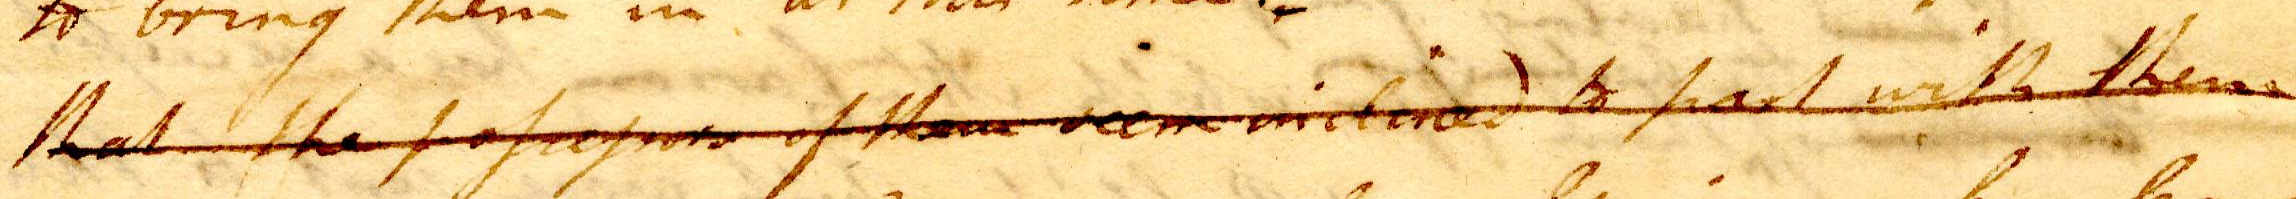[that the possessions of them seem inclined to part with them]
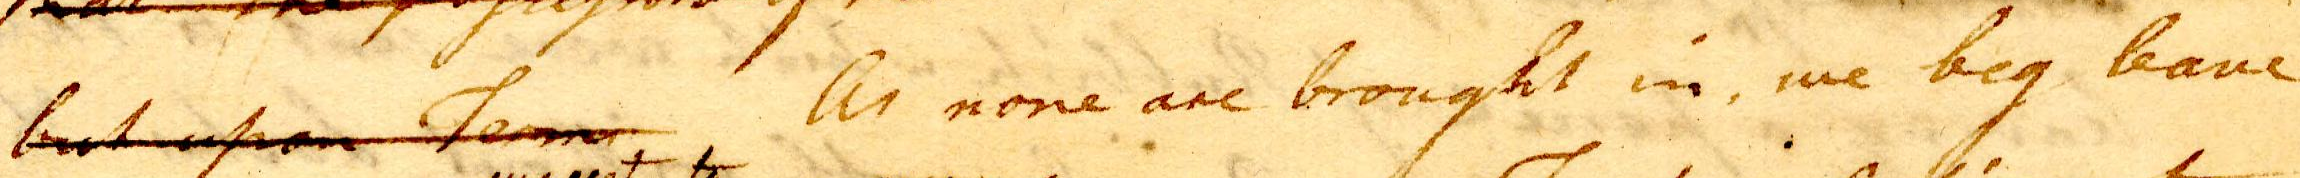[but upon Terms] As none are brought in, we beg leave
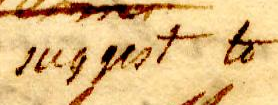suggest to
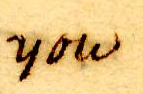you
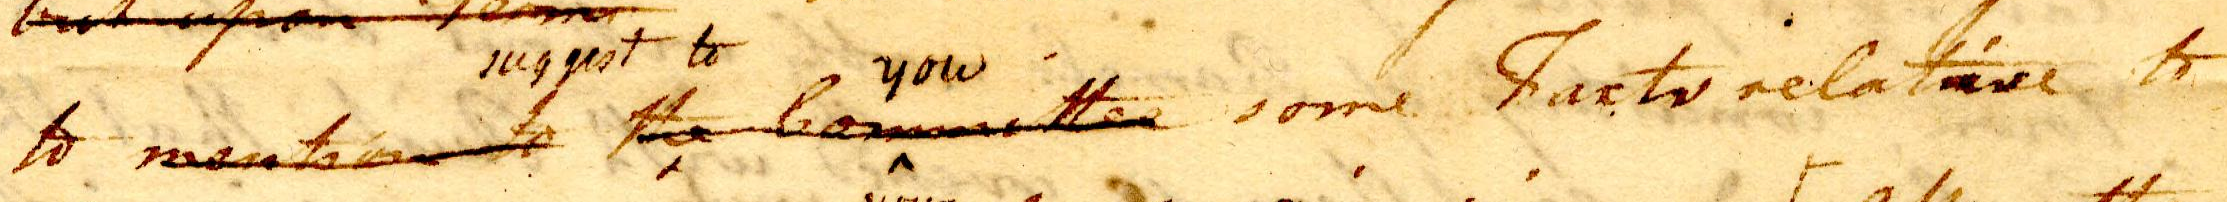to [mention to] [the Committee] some Facts relative to
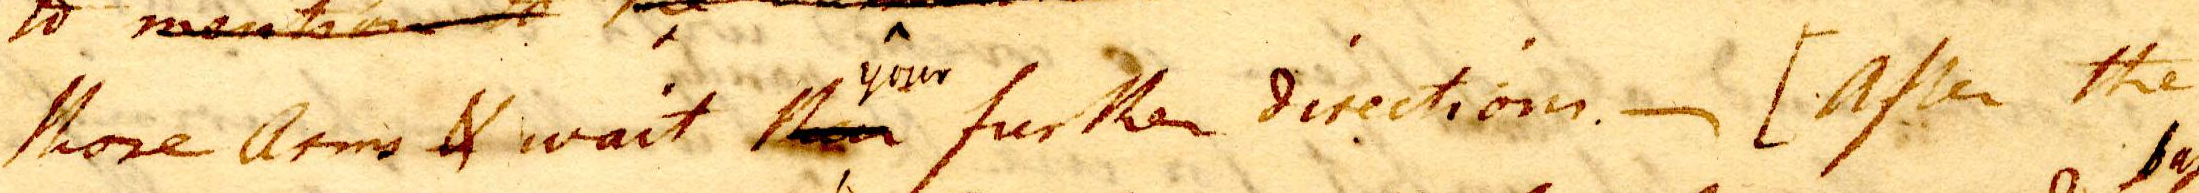those Arms & wait [their] further directions. (After the
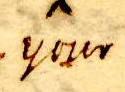your
